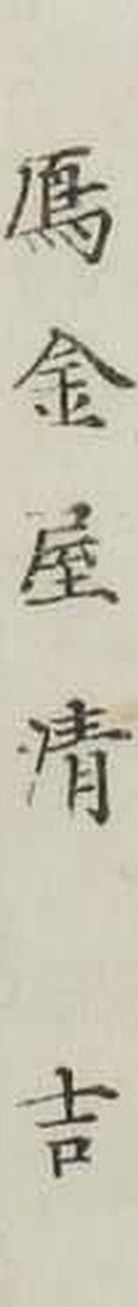鳫金屋清吉
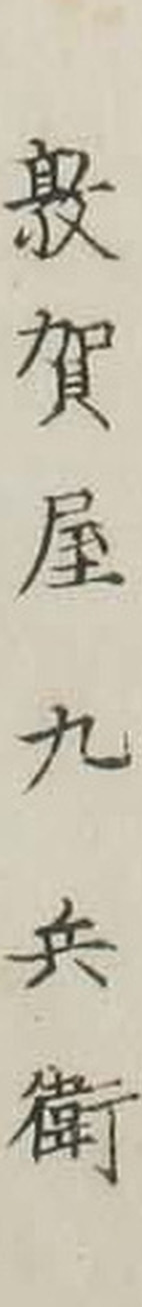敦賀屋九兵衛
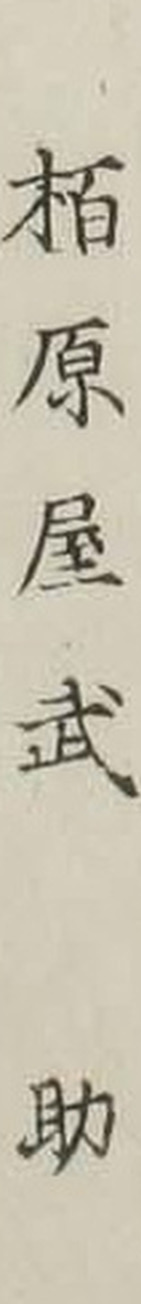栢原屋武助
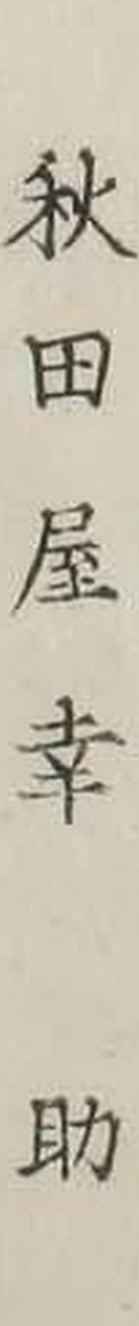秋田屋幸助
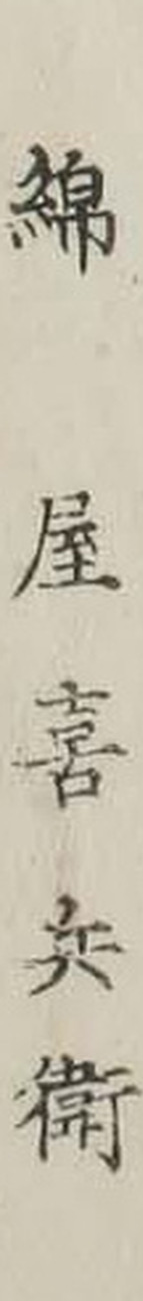綿屋喜兵衛
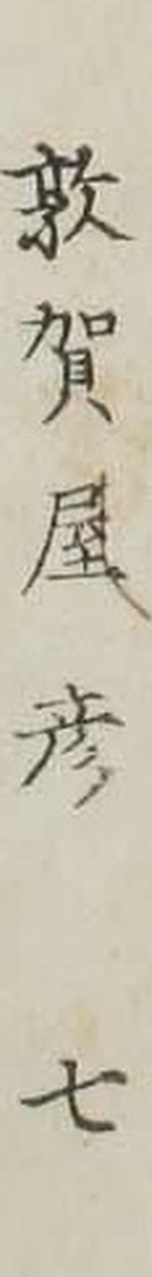敦賀屋彦七
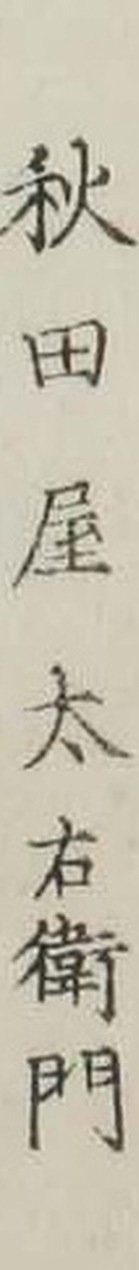秋田屋太右衛門
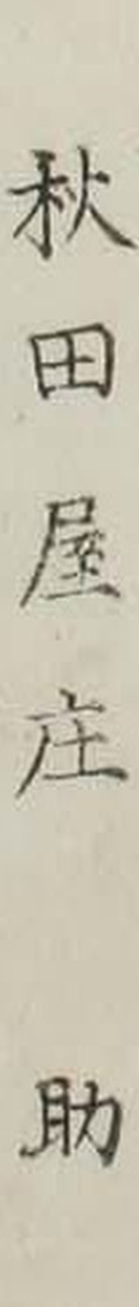秋田屋庄助
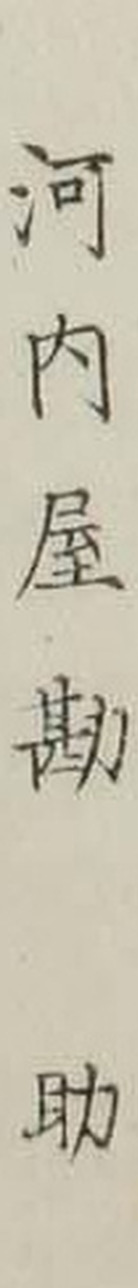河内屋勘助
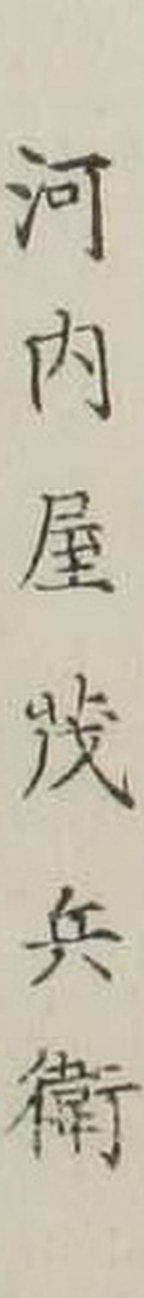河内屋茂兵衛
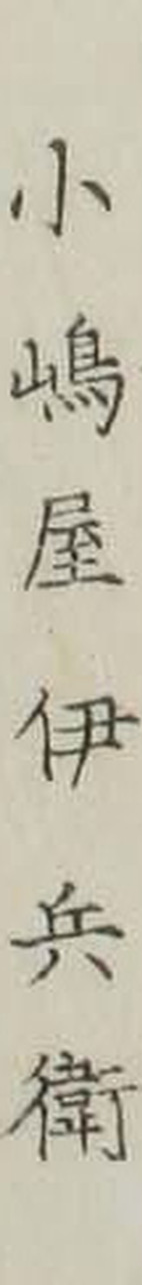小嶋屋伊兵衛
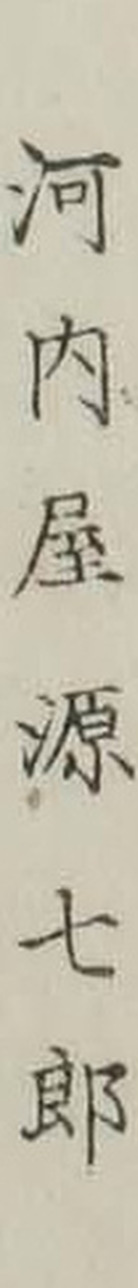河内屋源七郎
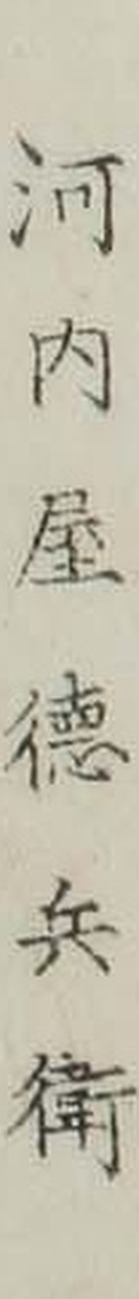河内屋徳兵衛

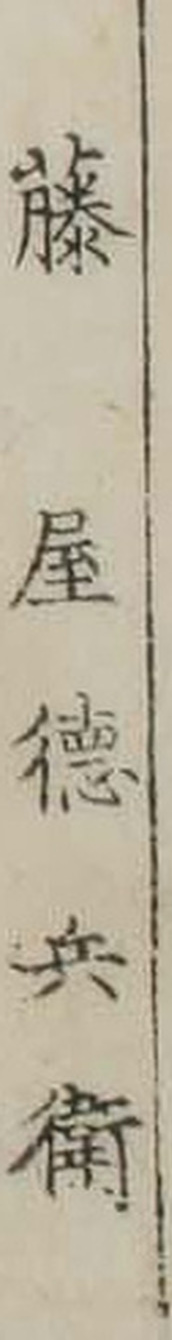藤屋徳兵衛
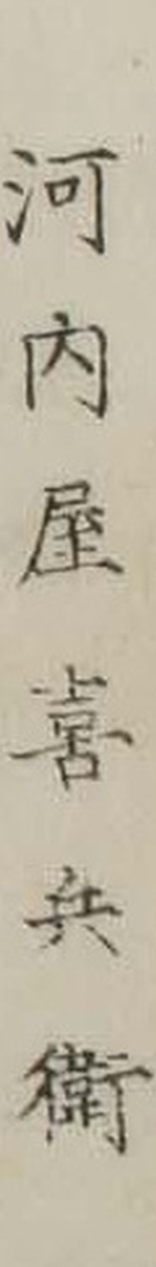河内屋喜兵衛
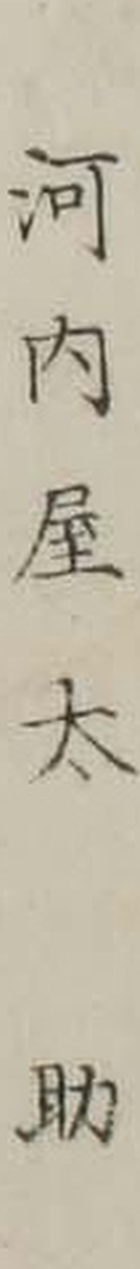河内屋太助
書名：開化往来
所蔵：東京学芸大学教育コンテンツアーカイブ
